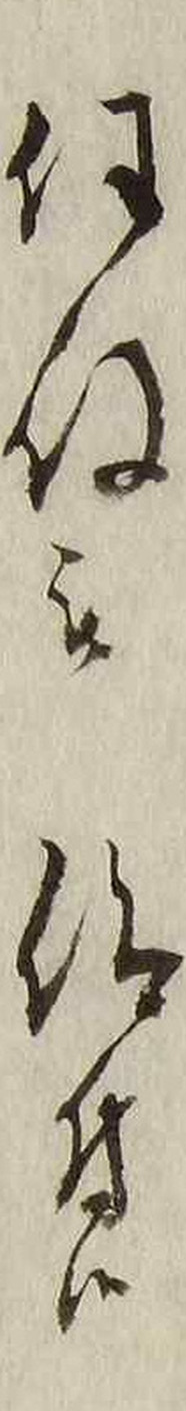役被仰付候
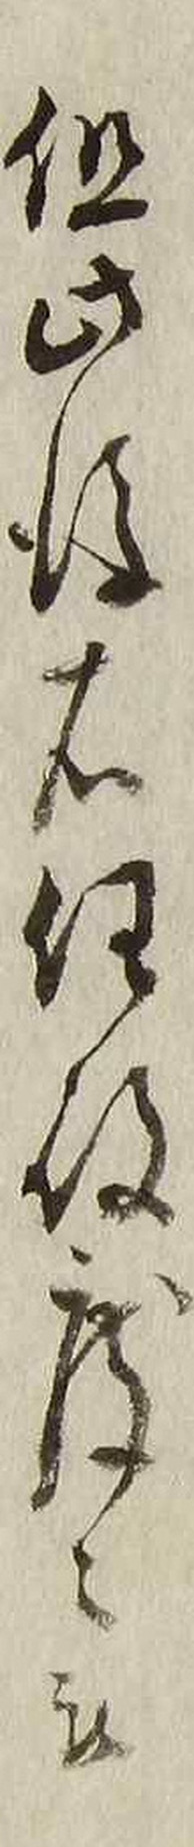但此後右任役度々被
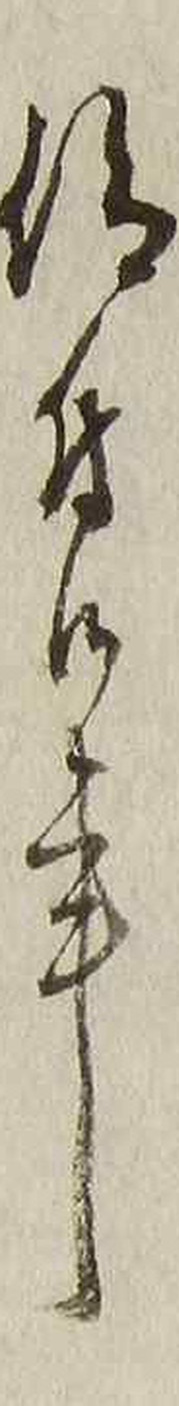仰付候事
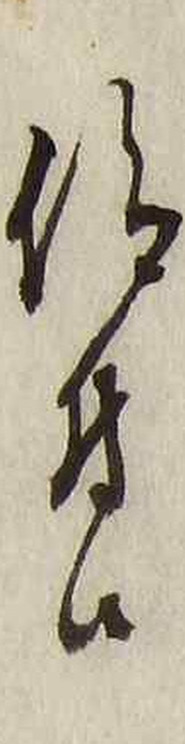仰付候

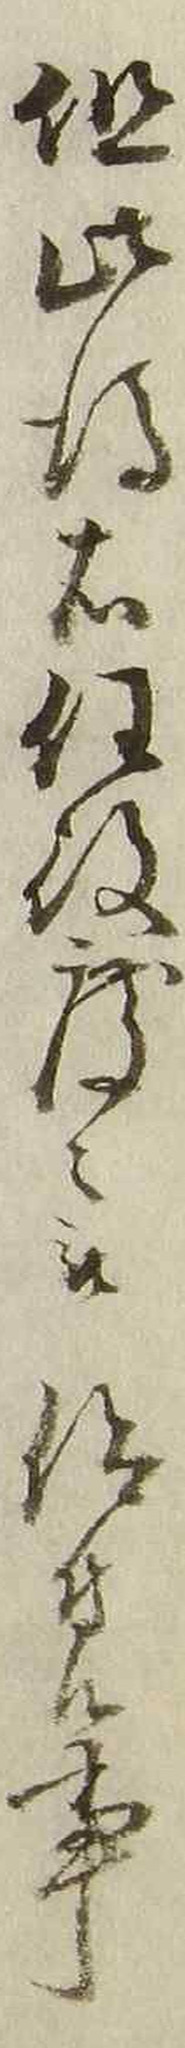但此後右任役度々被仰付候事
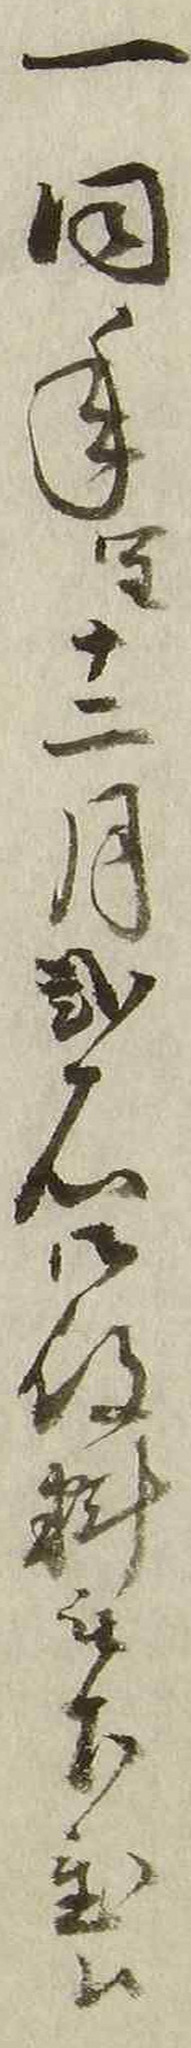一同年閏十二月弐石御役料被下置候
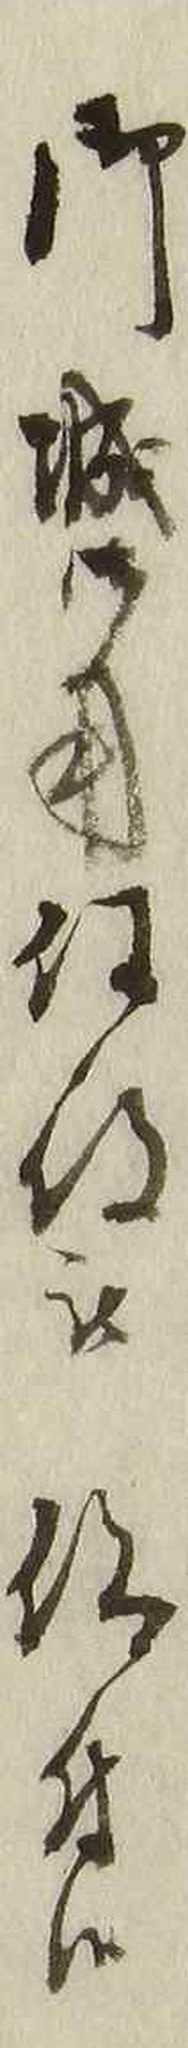御城御用任役被仰付候
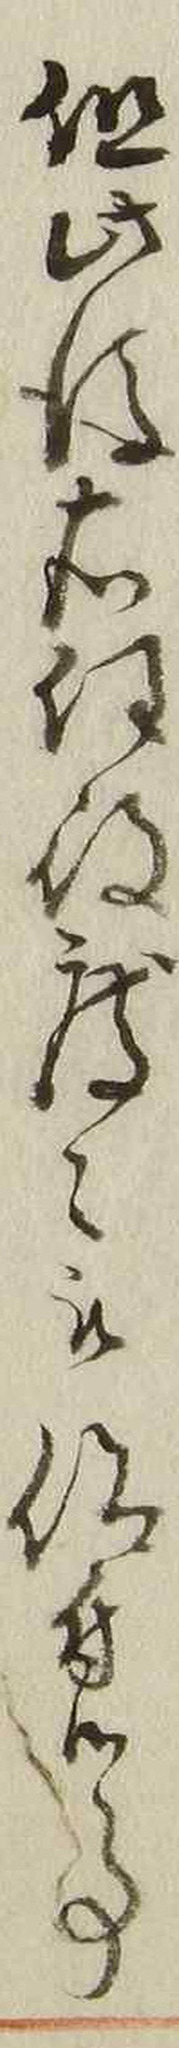但此後右任役度々被仰付候事
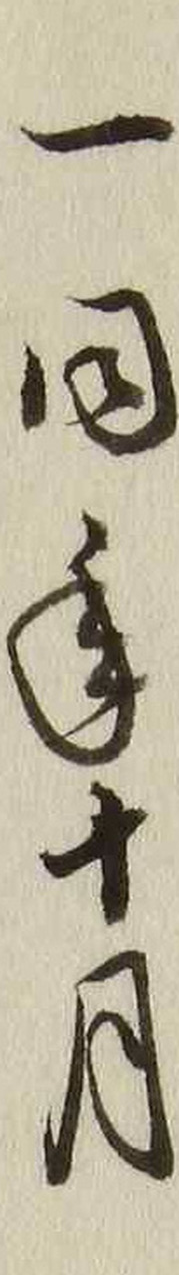一同年十月
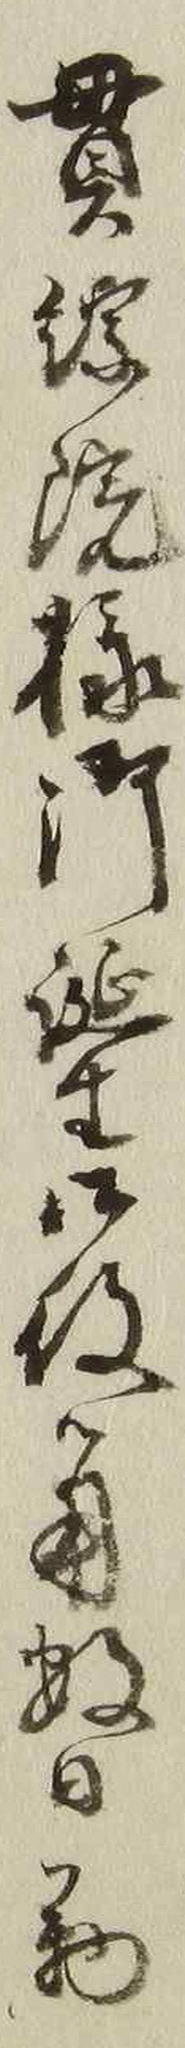貫綜院様御誕生御役御用数日勤
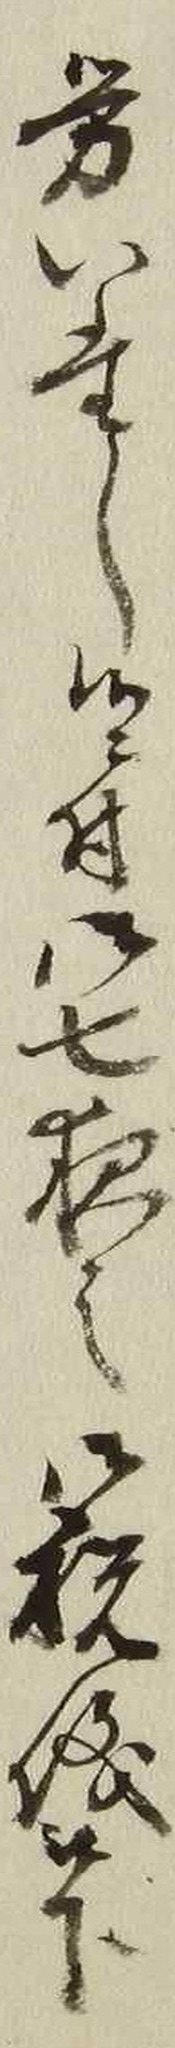労いたし候ニ付御七夜之御祝儀被下
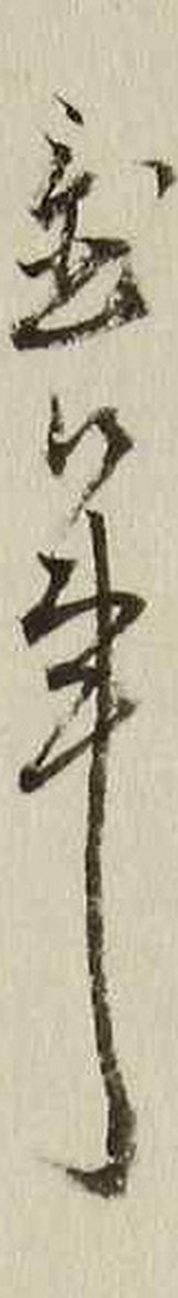置候事
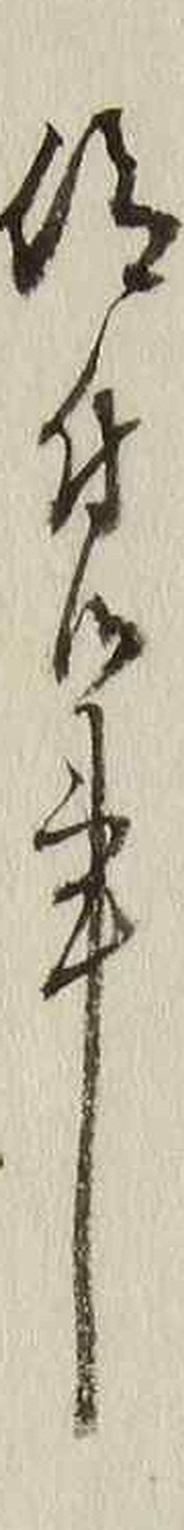仰付候事
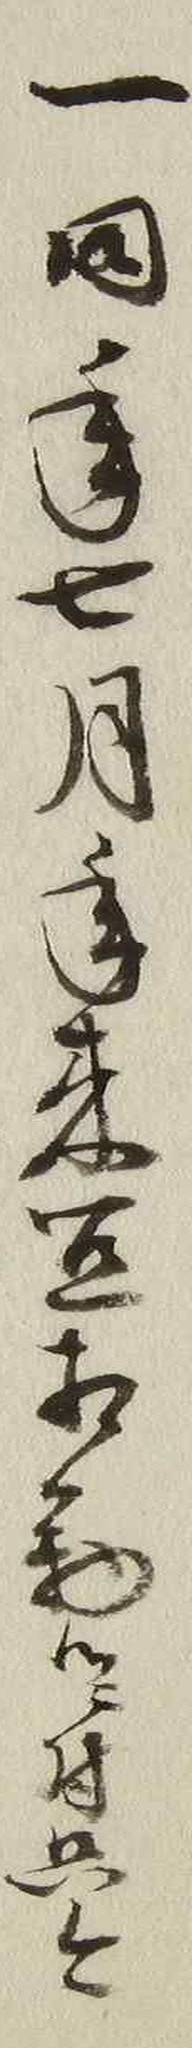一同年七月年来宜相勤候ニ付只今
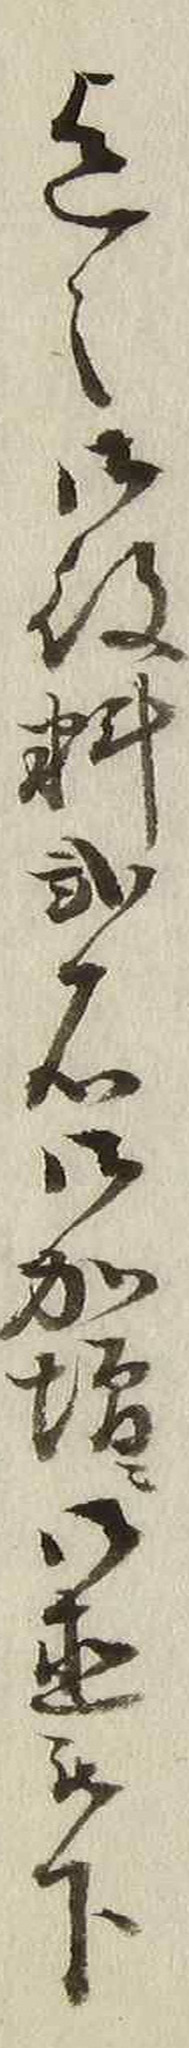迄之御役料弐石御加増ニ御直被下
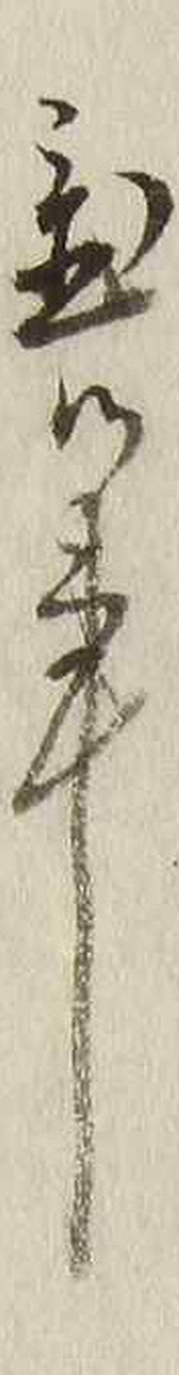置候事
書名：諸士系譜　巻之39　は之部7
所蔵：会津若松市立会津図書館
